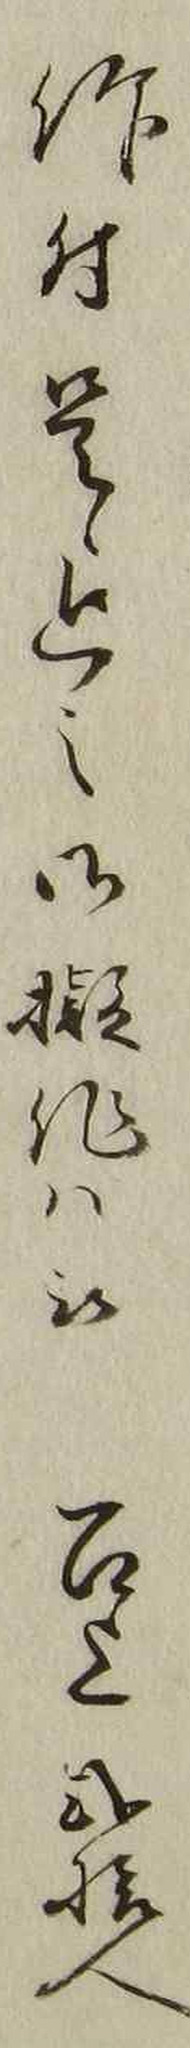仰付是迄之御擬作ハ被召上弐拾人
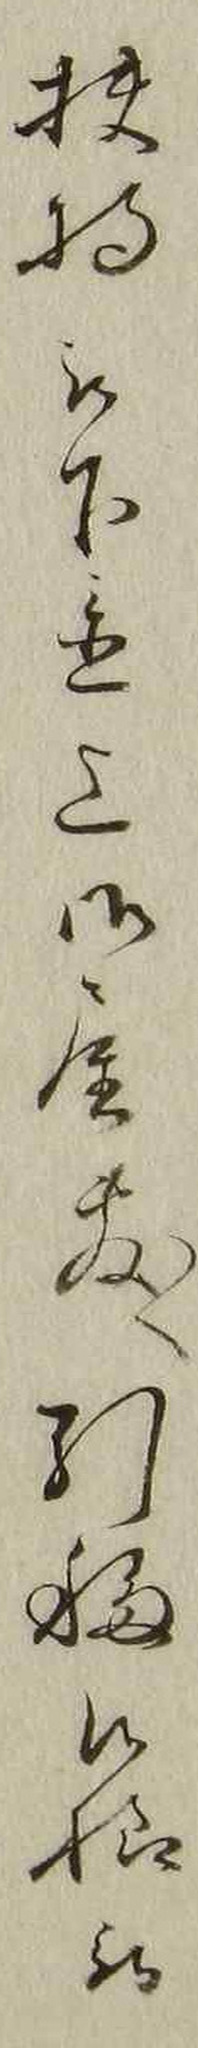扶持被下置上御屋敷へ引移候様被
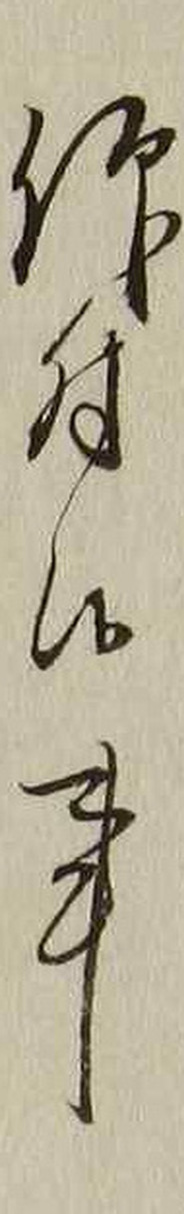仰付候事
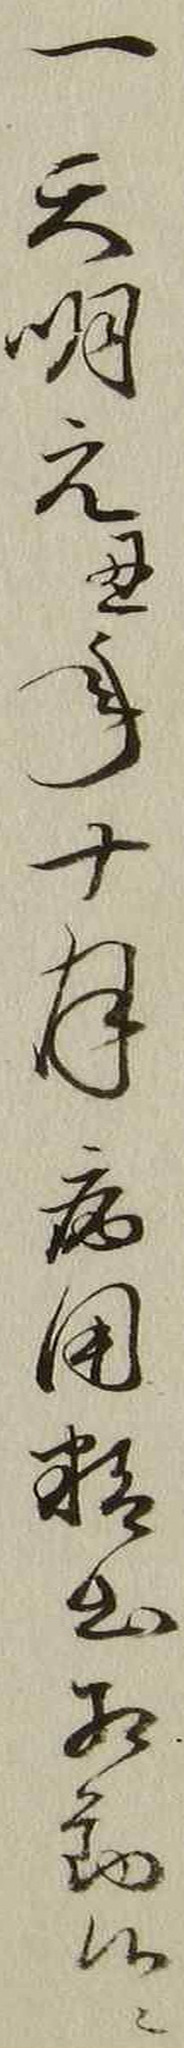一天明元丑年十月病用精出相勤候ニ
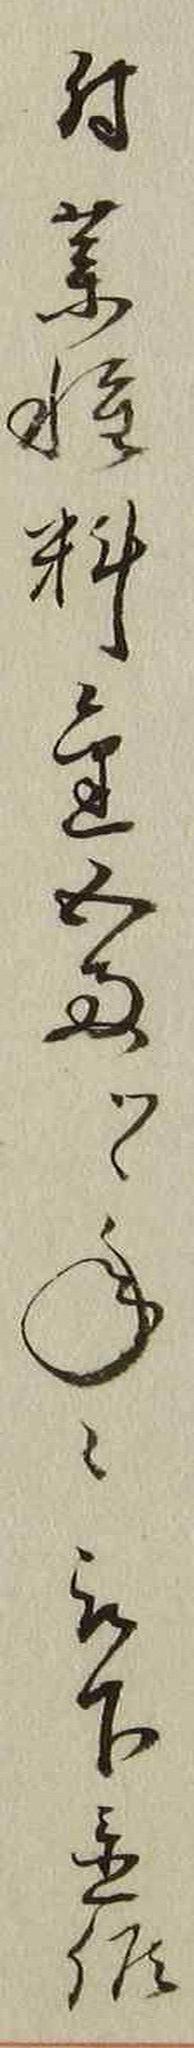付薬種料金五両ツヽ年々被下置候
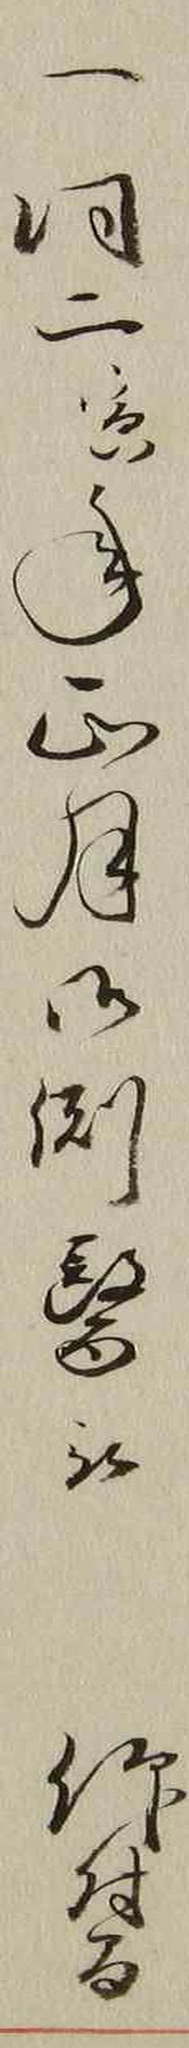一同二寅年正月御側医被仰付間
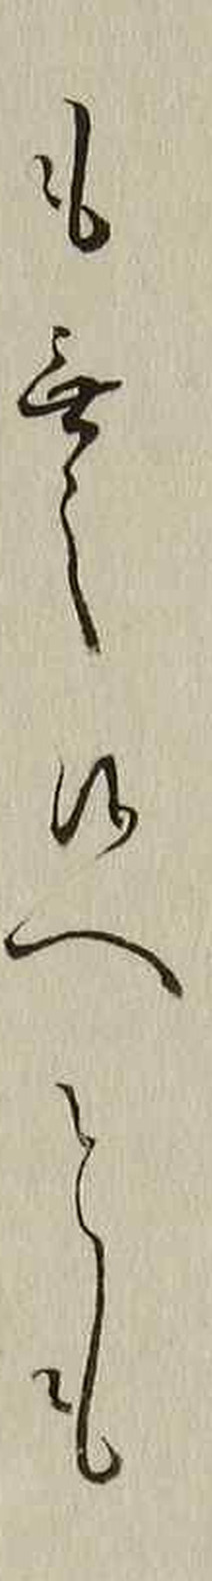も無之候へとも
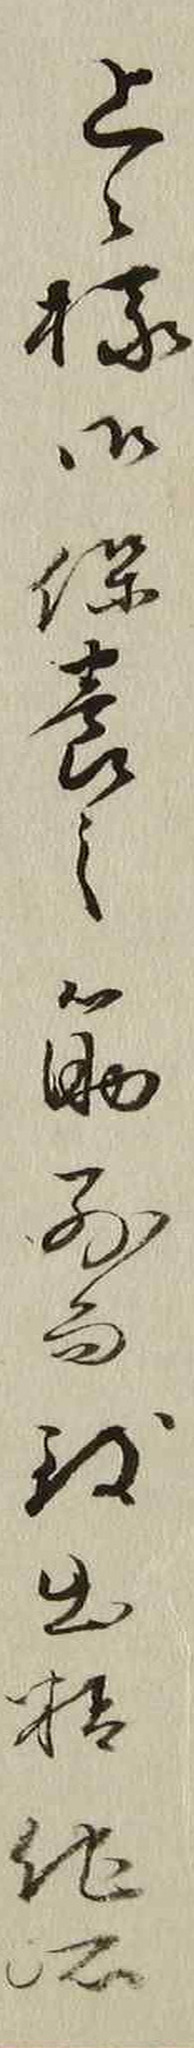上々様御保養之筋別而致出精他所
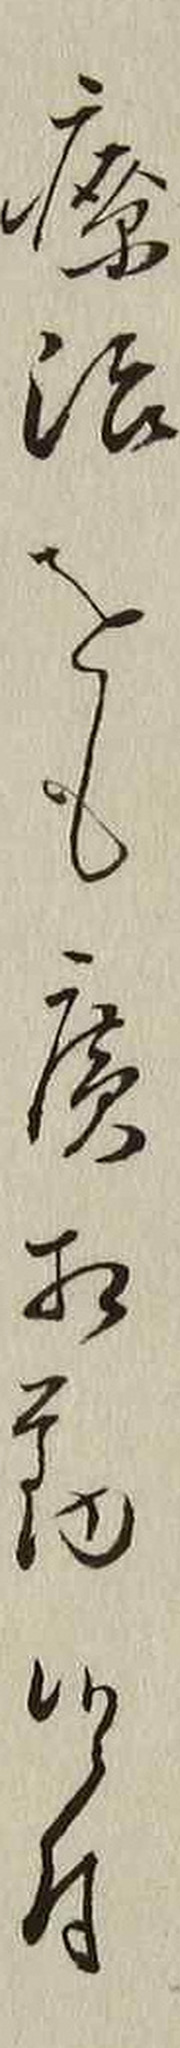療治をも広相勤候ニ付
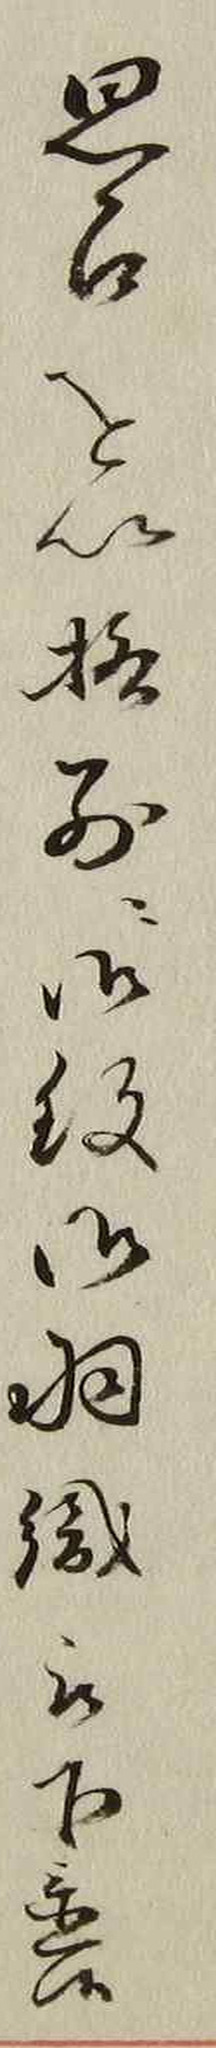思召を以格別ニ御紋御羽織被下置候
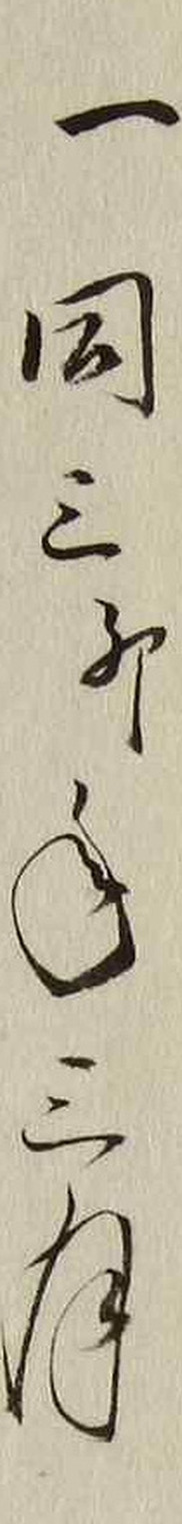一同三卯年三月
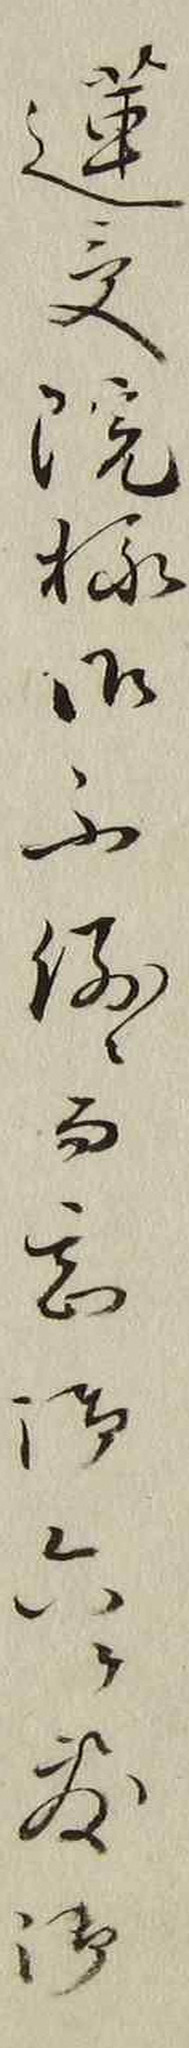蓮受院様御不例ニ而甚御六ケ敷御
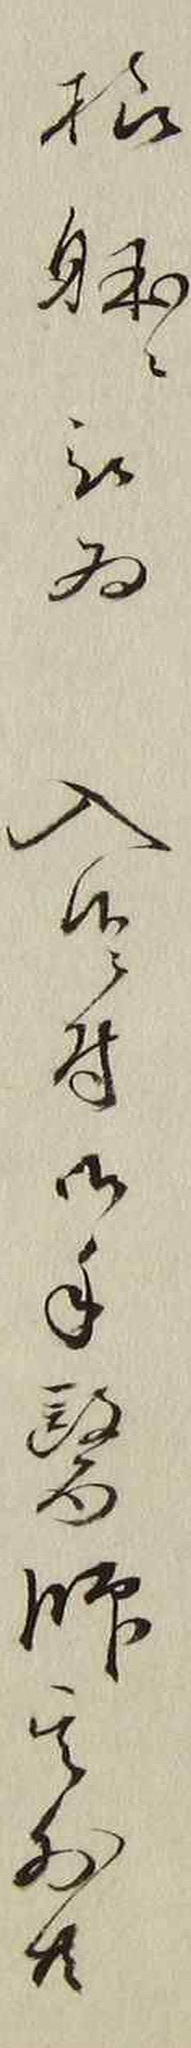様体ニ被為入候ニ付御手医師其外共
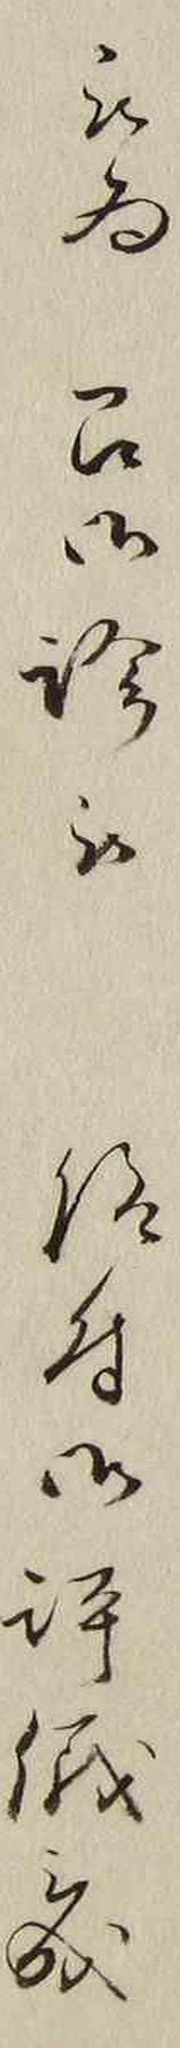被為召御診被仰付御評儀被成
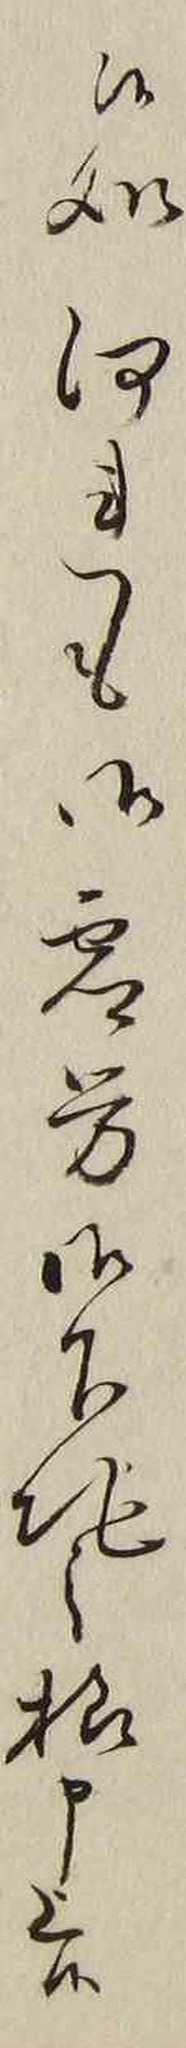候処何れも御虚労御下地之様申上候
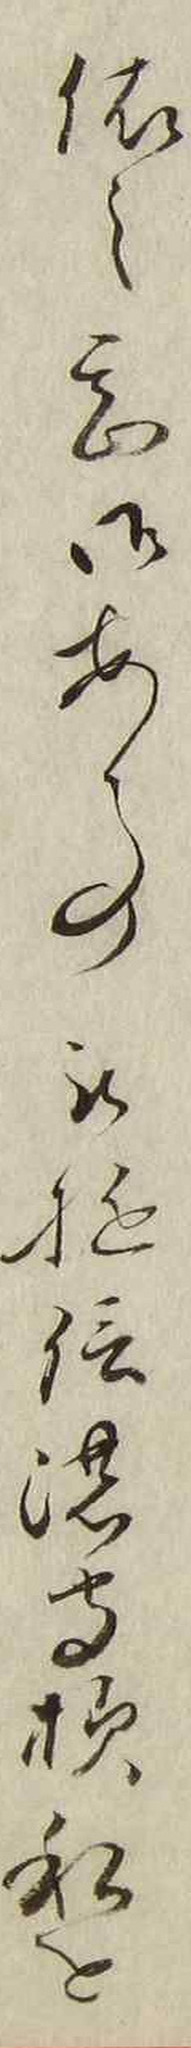依之甚御安事被遊信濃守様私を
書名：諸士系譜　巻之8　い之部8
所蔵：会津若松市立会津図書館
